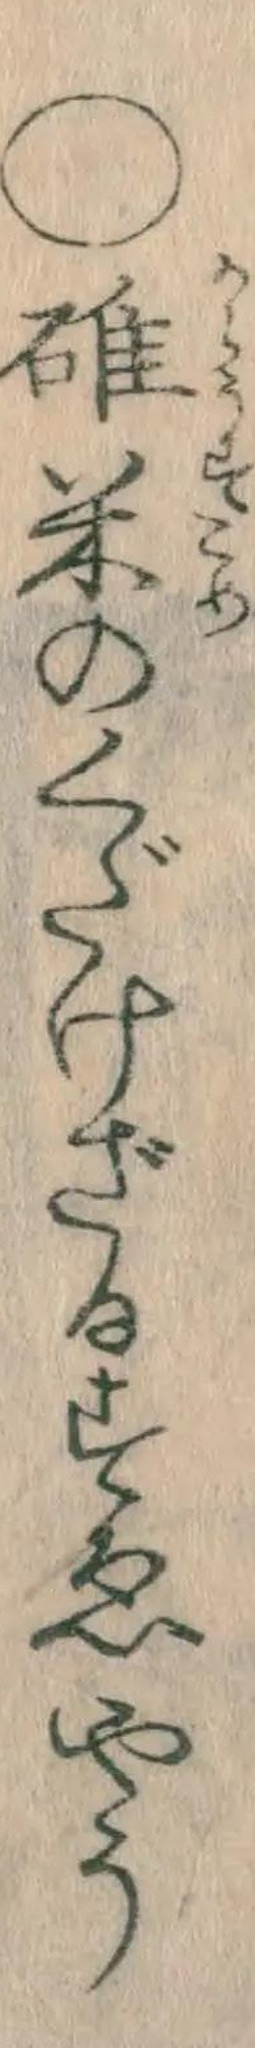○碓米のくだけざるすゑやう
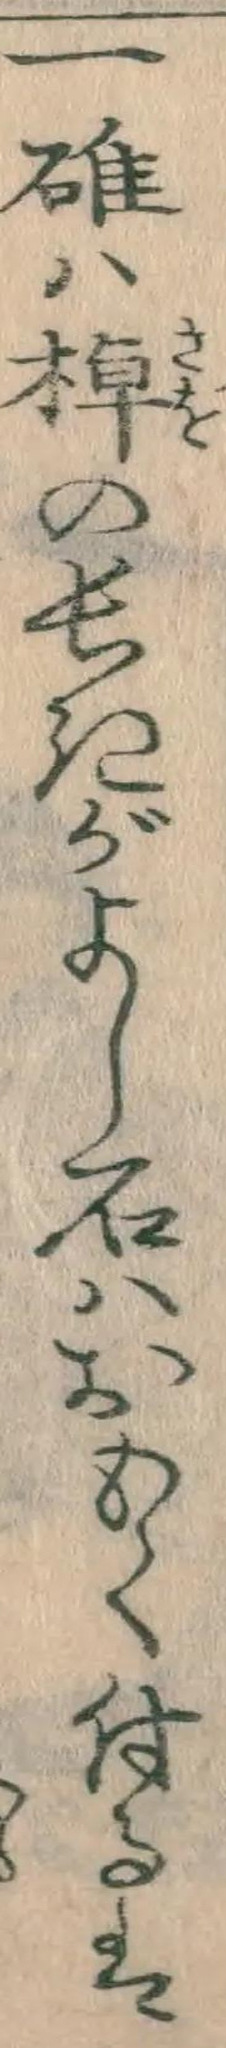一碓は棹の長きがよし石はおもく付るは
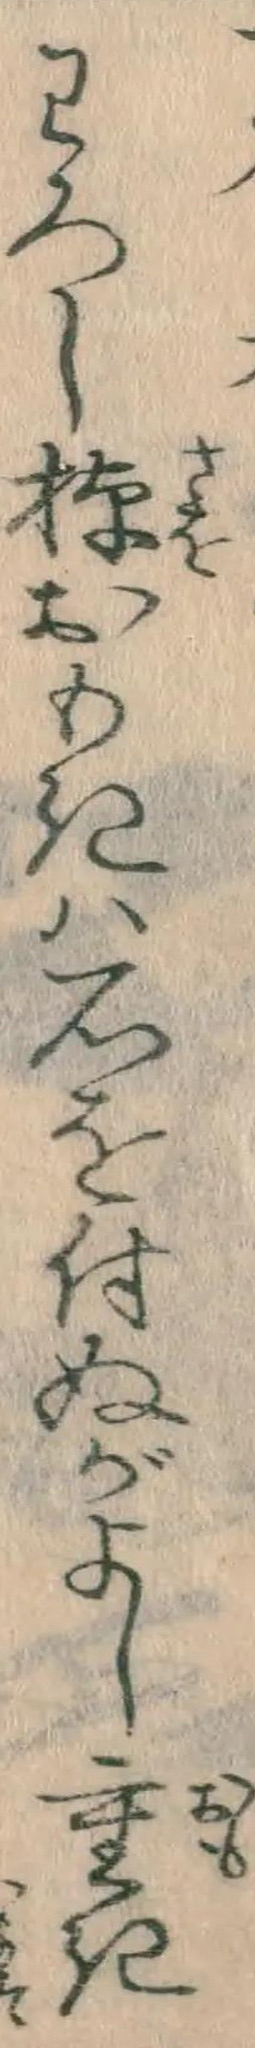わろし棹おもきは石を付ぬがよし重き
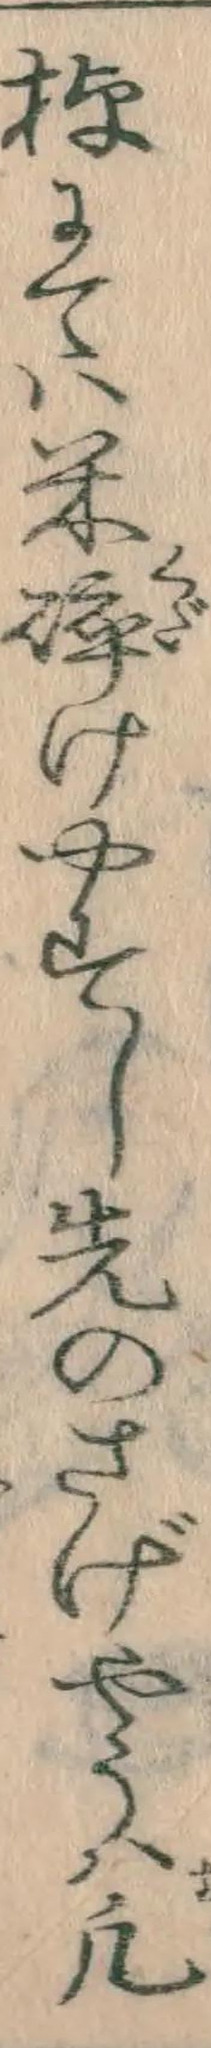棹にては米砕けやすし先のさげやうは凡
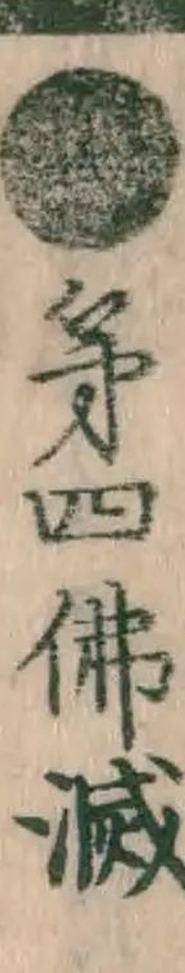●第四仏滅
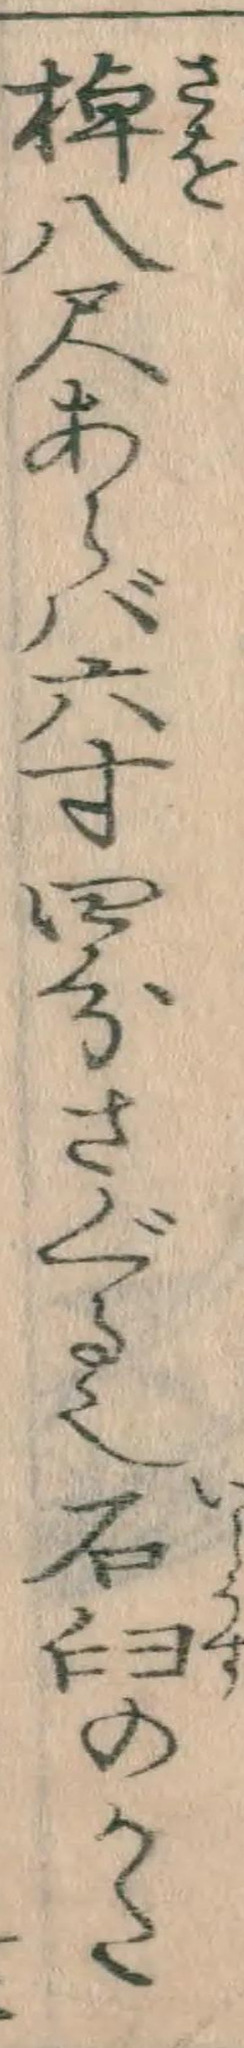棹八尺あらば六寸四分さぐる也石臼のかた
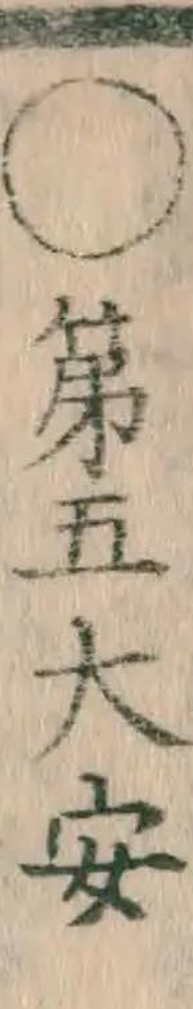○第五大安
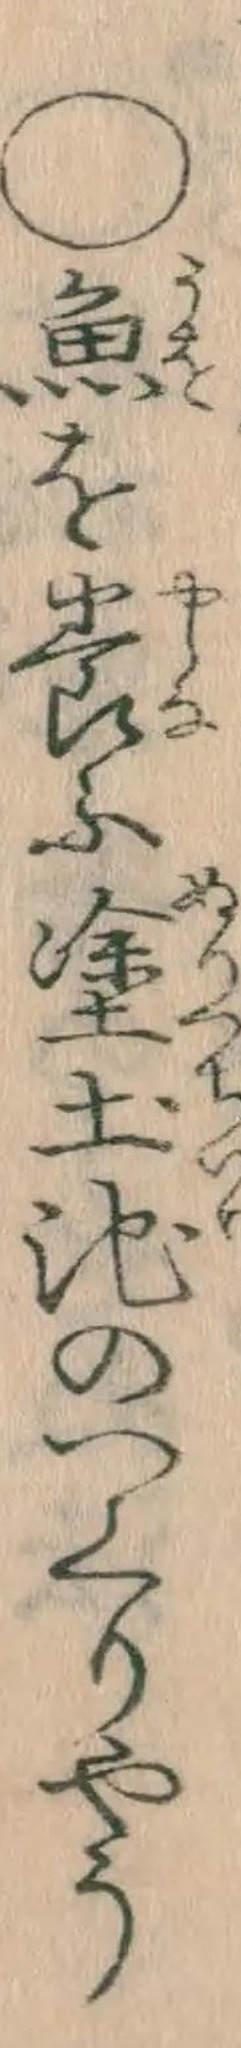○魚を養ふ塗土池のつくりやう
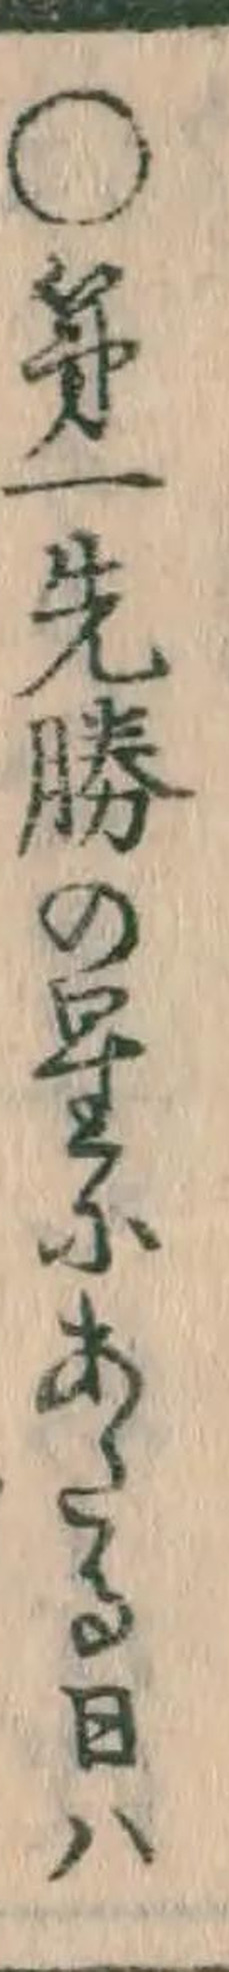○第一先勝の星にあたる日は
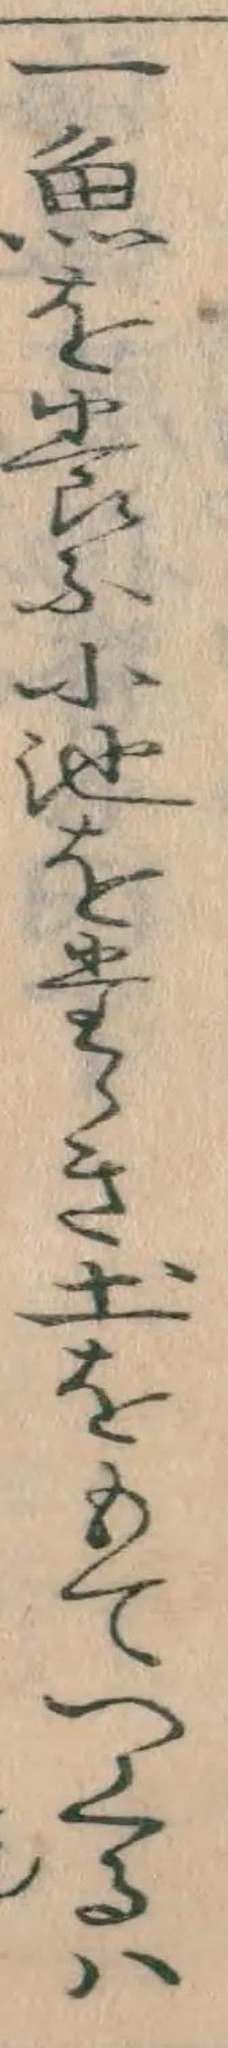一魚を養ふ小池をたゝき土をもてつくるは
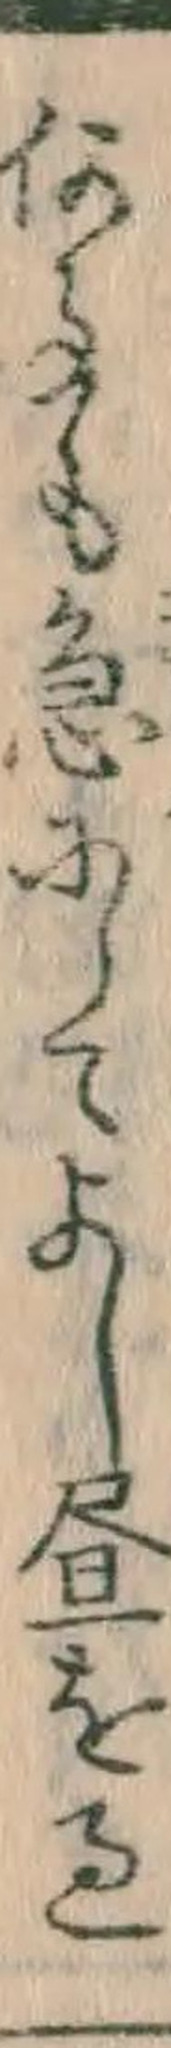何事も急にしてよし昼を過
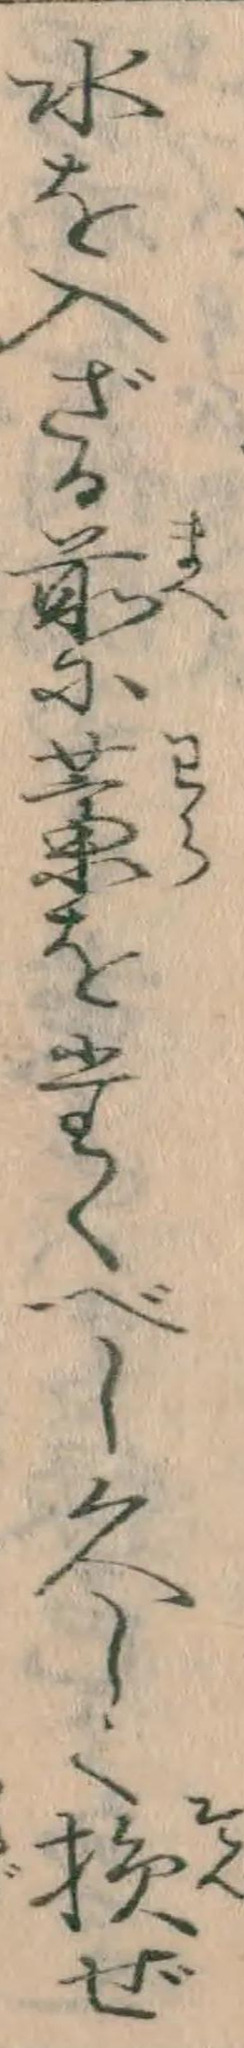水を入ざる前に藁をたくべし久しく損ぜ
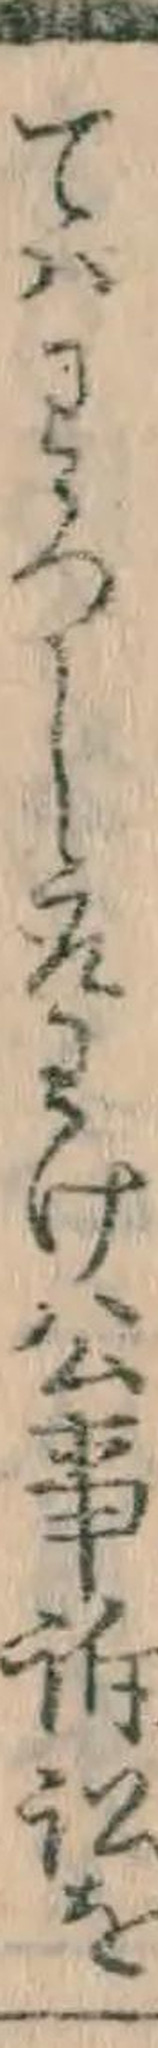てはわろし取わけ公事訴訟を
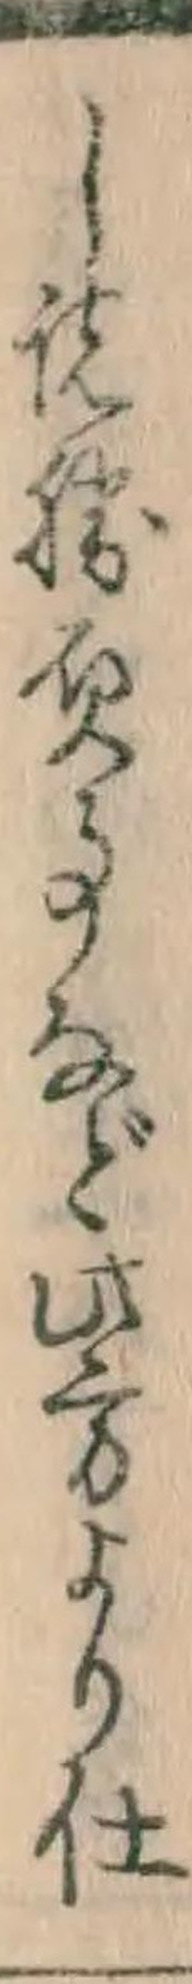し諸勝負事など此方より仕
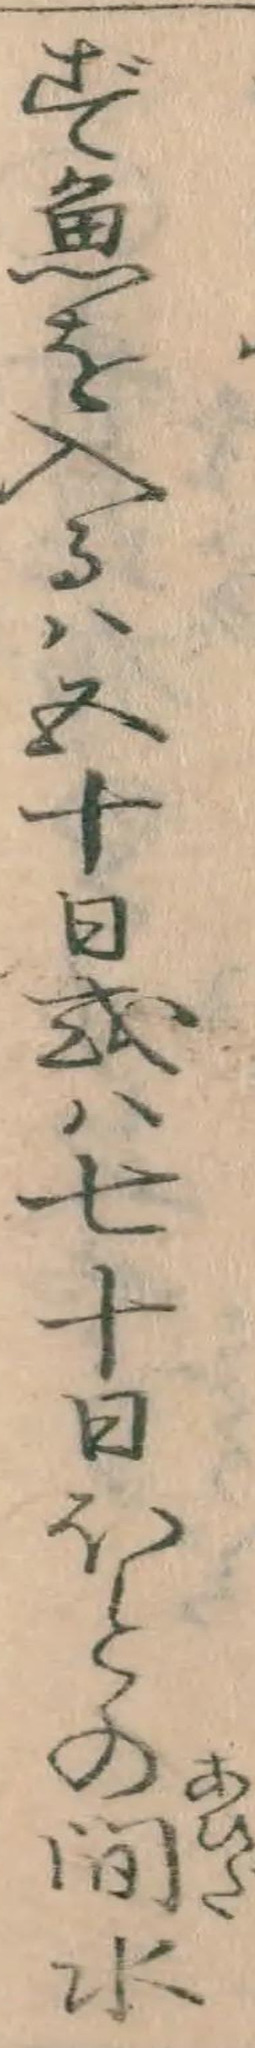ず魚を入るは五十日或は七十日ほとの間水
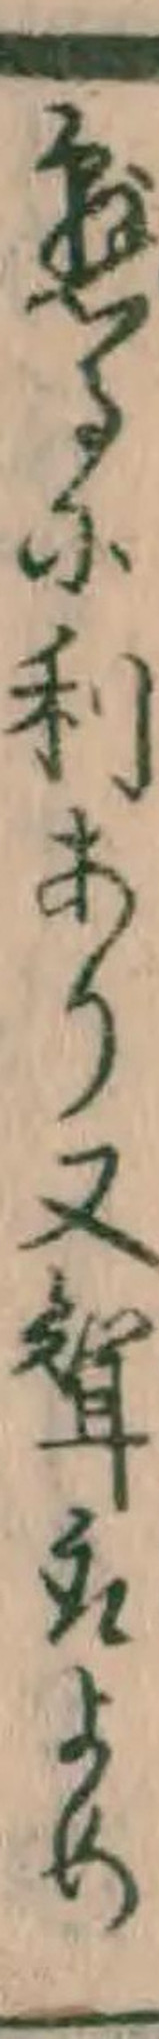懸るに利あり又婿取よめ
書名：広益秘事大全 3巻. [1]
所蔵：国立国会図書館 National Diet Library, JAPAN
